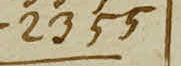2355
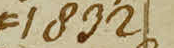1832
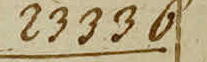23336
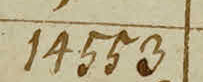14553
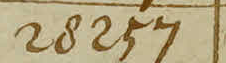28257
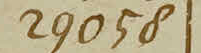29058
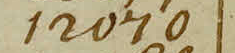12070
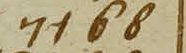7168
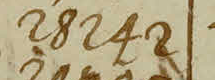28242
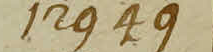12949
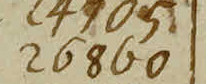26860
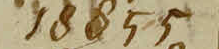18855
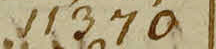11370
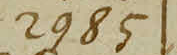2985
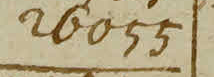26055
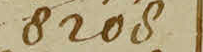8208
